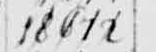18672
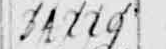34229
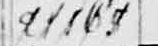11165
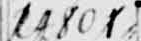14801
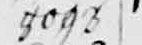5093
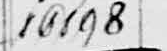16198
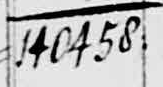140458
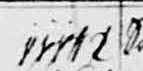11112
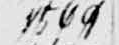1569
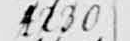4230
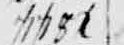7752
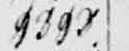9392
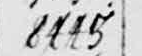8445
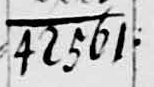42561
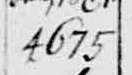4675
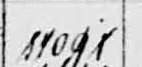11091
